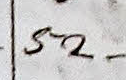52
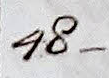48
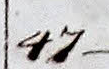47
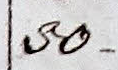30
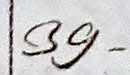39
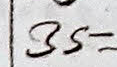35
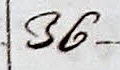36
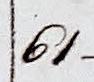61
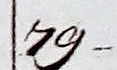79
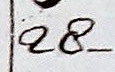28
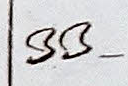33
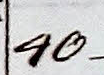40
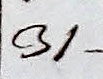31
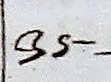35
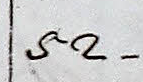52
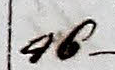46
